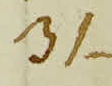31
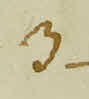3
